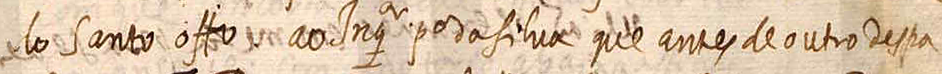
do Santo offo. ao Inqor. po da silua que antes de outro despa
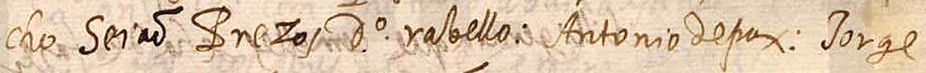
cho Seiaõ Prezos do. rabello: Antonio de pax: Iorge
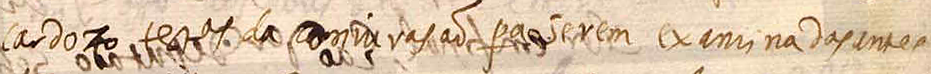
cardozo testas da coniurasaõ pa serem examinadas antes
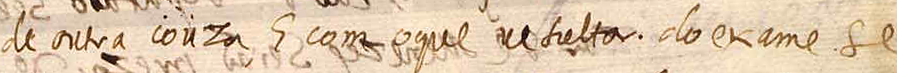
de outra couza, E com o que resultar do exame se
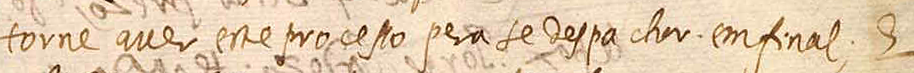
torne a uer este processo pera se despachar em final; E
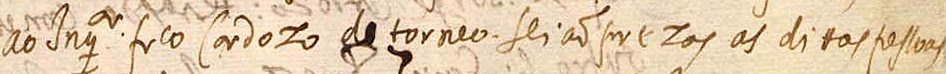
ao Inqor. frco Cardozo de torneo seiaõ prezas as dittas pessoas
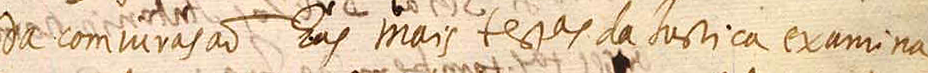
da comiurasaõ E as mais testas da Iustica examina
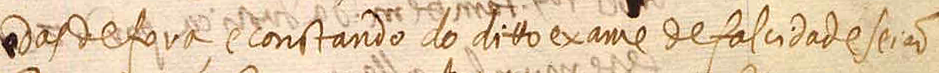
das de fora, e constando do ditto exame de falcidade seiaõ
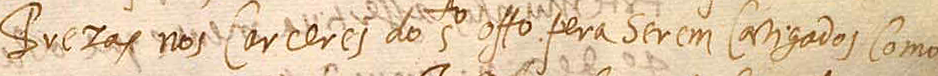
Prezas nos Carceres do sto offo. pera serem Castigados Como
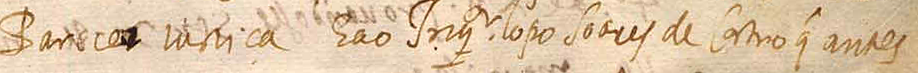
Parecer iustiça E ao Inqor. lopo Soares de Castro q̄ antes
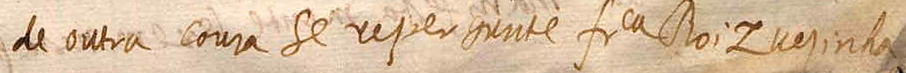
de outra couza se repergunte frca Roiz uezinha
